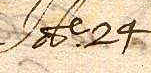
Id̄.e 24
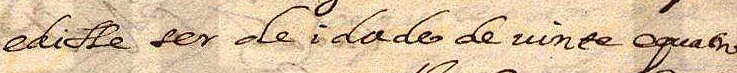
e disse ser de idade de uinte e quatro
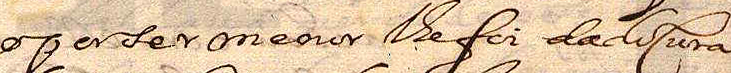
e por ser menor lhe foi dado Cura
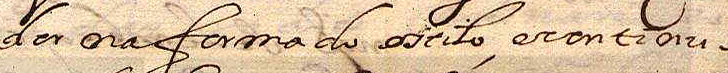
dor na forma do estilo, e continua
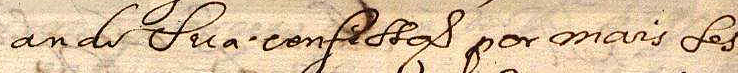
ndo Sua confissaõ por mais ses
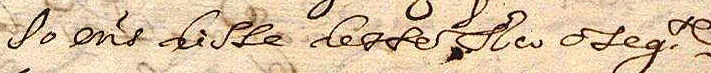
soen̄s disse deste Reo, o seg.te
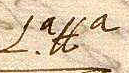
1.a tt.a
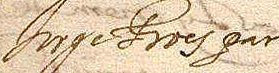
Jorge Froes par
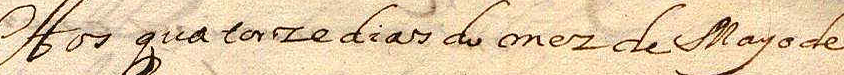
Aos quatorze dias do mez de Mayo de
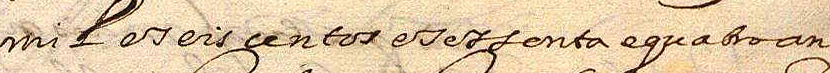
mil e seiscentos e sessenta e quatro an
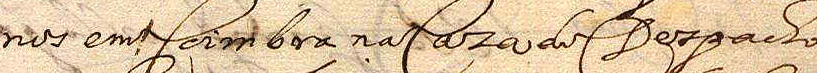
nos em Coimbra na Caza do Despacho
